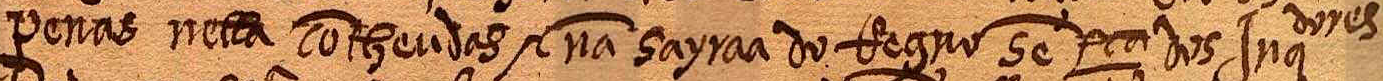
penas nella c̄otheudas e n̄a sayraa do Regno s̄e Lça dos Jnqdores
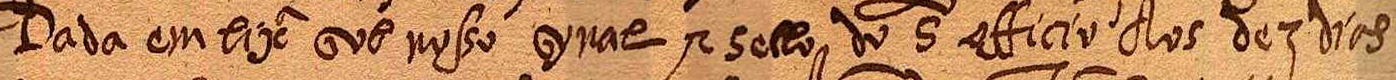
Dada em lixa sob nosso synal e sello do Sto officio Aos dez dias
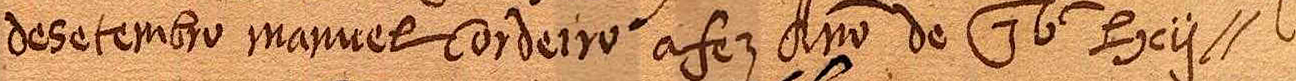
de setembro manuel Cordeiro a fez An̄o de j̄ bc Lxij //
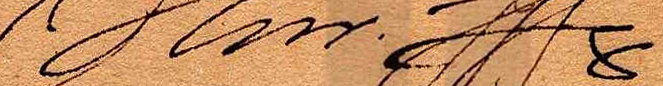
O Car. Jffꝭ
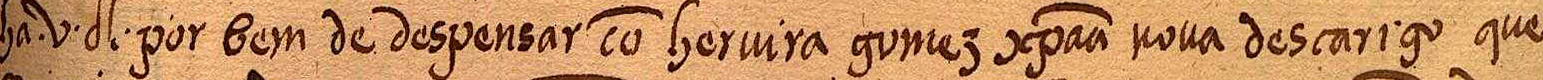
ha .V. A. por bem de despensar c̄o heruira gomez xpāa noua descarigo que
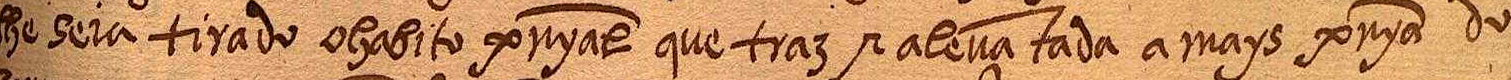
lhe seia tirado o habito pn̄yal que traz e aleūatada a mais pn̄ya do
